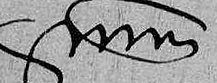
Sn̄nor
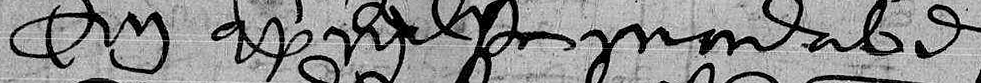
Em ꝯpimto deste mādado dj
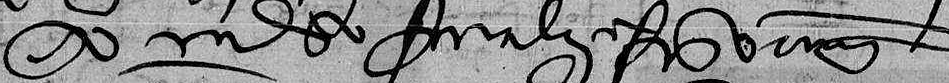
go eu dso fernandez escvam
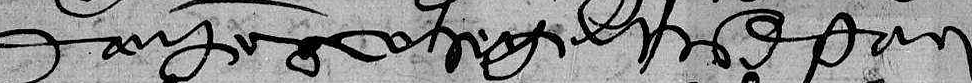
dante os coregedores desta cj
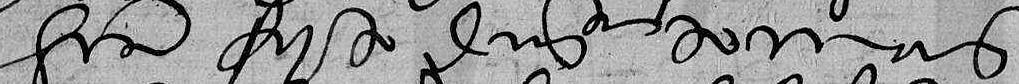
huū fejto de mte tomas
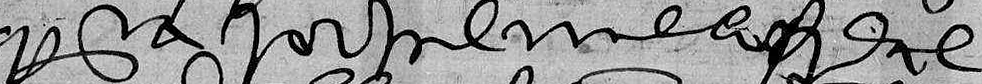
ꝯtra JorJe de melo fjdal
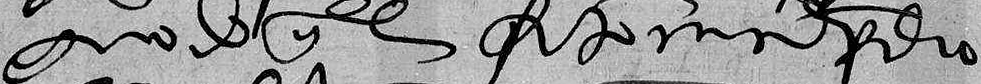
guo do q̄ll fetō me pedio
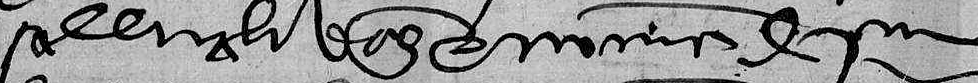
salluador vāz enome de seu
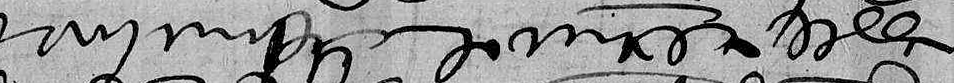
pay mestre tomas o trella
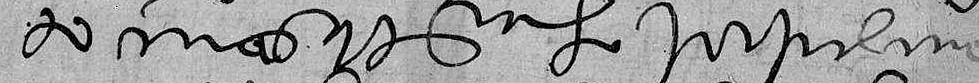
tomas ꝯtra ho JorJe de me
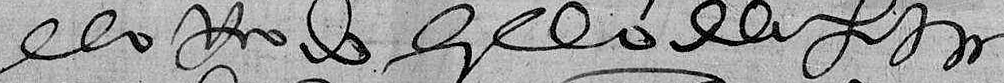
llo Reo do ljbelo dele ho tre
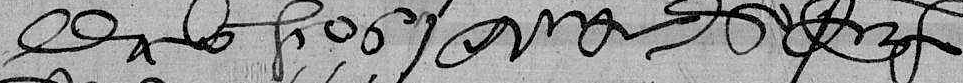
llado he o sjgjnte dso fr̄z ho
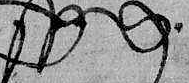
sp̄uj.
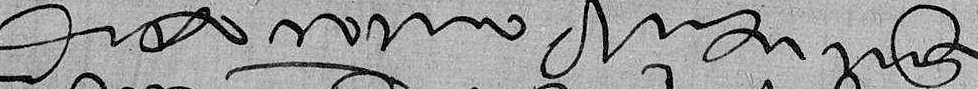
digo como Autor mte
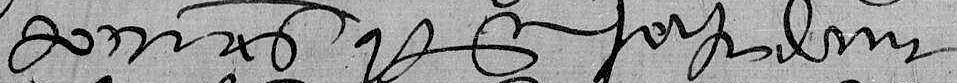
tomas ꝯtra JorJe de me
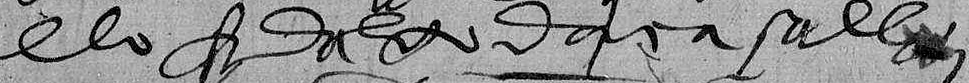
llo fydalgo da casa del Rej
